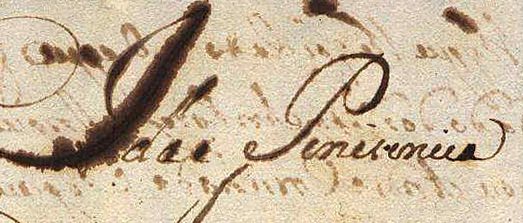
Ida e Penitencia
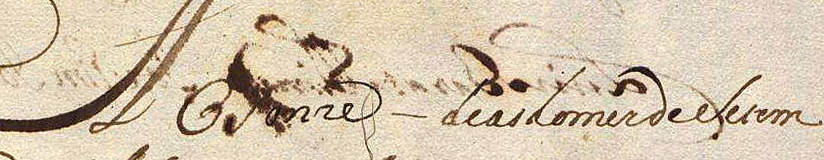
Aos onze dias do mez de Setem
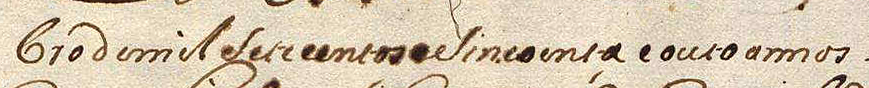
bro de mil setecentos, e Sincoenta, e outo annos.
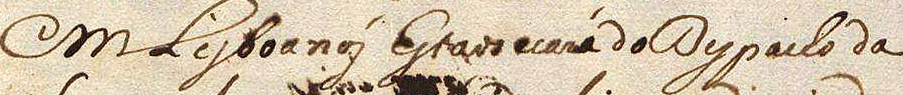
Em Lisboa nos Estaos e caza do Despacho da
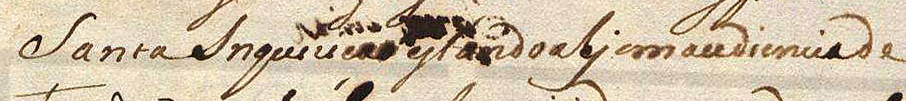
Santa Inquisiçaõ estando ahj em audiencia de
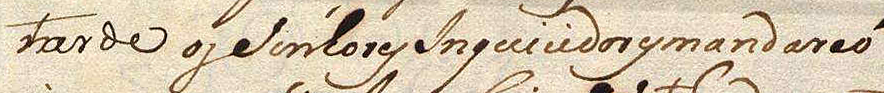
tarde os Senhores Inquisidores mandaraõ
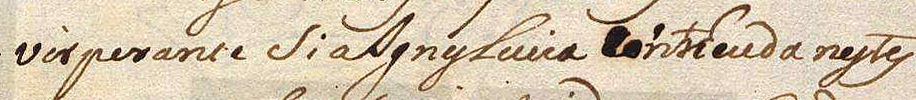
vir perante Si a Ignes Luiza contheuda nestes
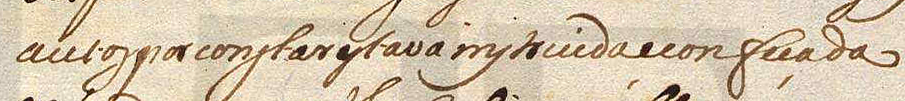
autos por constar estava instruida, e confeçada
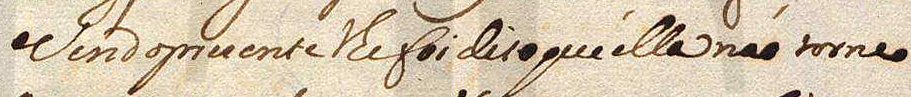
e Sendo presente lhe foi dito que ella naõ torne
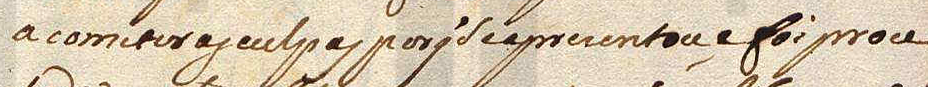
a cometer as culpas porq̄ se aprezentou, e foi proce
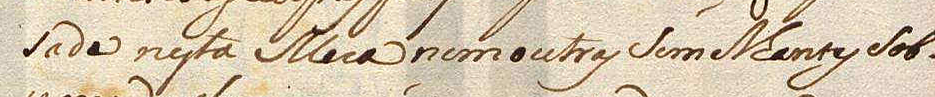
sada nesta Meza, nem outras semelhantes sob
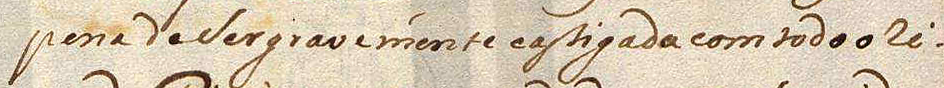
pena de Ser gravemente castigada com todo o Ri
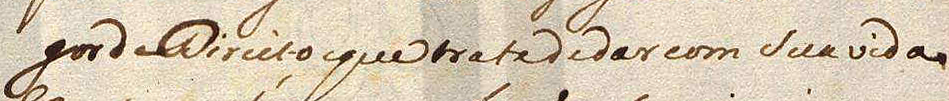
gor de Direito, e que trate de dar com sua vida
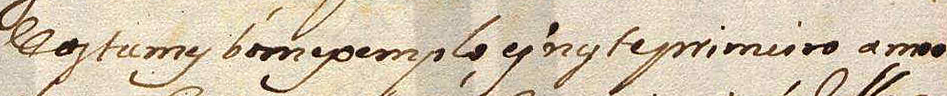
e costumes bom exemplo, e q̄ neste primeiro anno
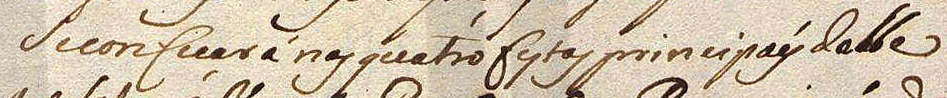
se confeçará nas quatro festas principaés delle
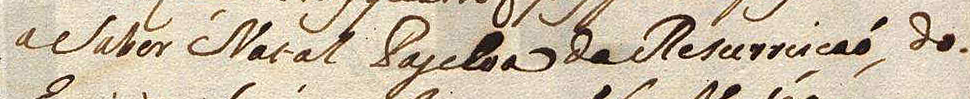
a Saber Natal, Paschoa da Resurreiçaõ, do
